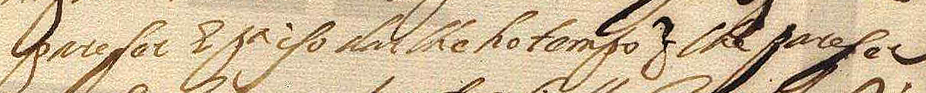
pareser E pa iso dar lhe ho tempo q̄ lhe pareser
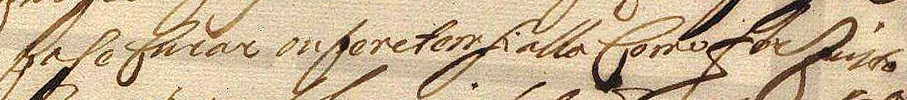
pa se Curar ou penetemsialla Como for Justo
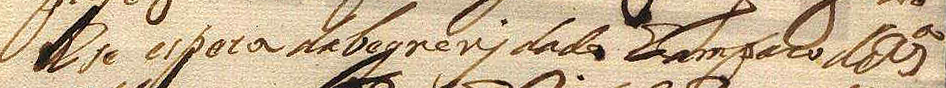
E se espera da begnenjdade E amparo de Vsa
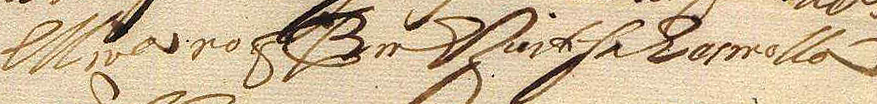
Ellma no q̄ R m E Justisa E esmolla
